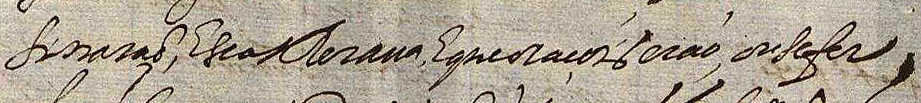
sinaraõ, E se as Rezaua, E que oraçois eraõ, ou se fez
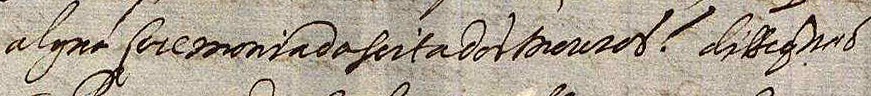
alguā Ceremonia da seita dos mouros? disse q̄ naõ
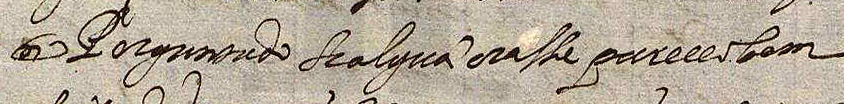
⁋ Perguntado se alguā ora lhe pareceo bem
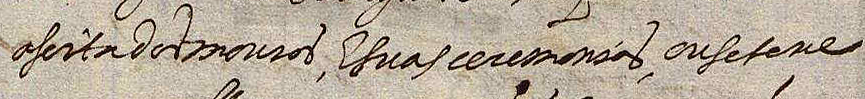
a seita dos mouros, E suas ceremonias, ou se teue
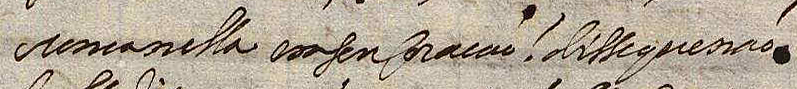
crença nella em seu Coraçaõ? disse que naõ
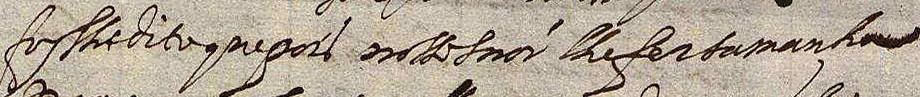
foylhe dito que pois nosso snor̄ lhe fez tamanha
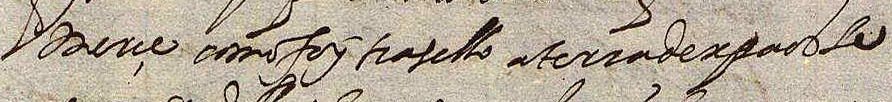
merce como foy trasello a terra de xpaõs se
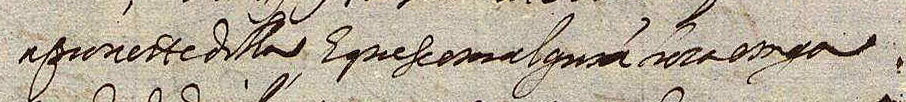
aproueite della E que se em alguma hora emga
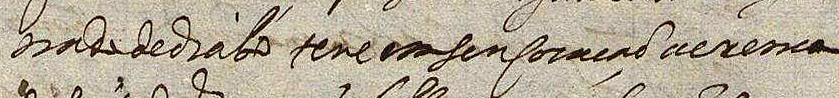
nado de diabo teue em seu Coraçaõ a crença
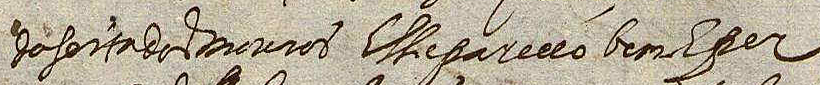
da seita dos mouros E lhe pareceo bem E por
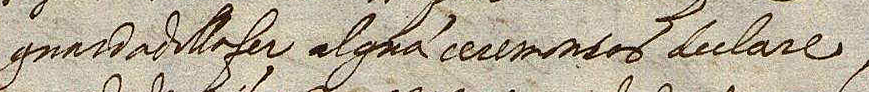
guarda della fez alguā ceremonias declare
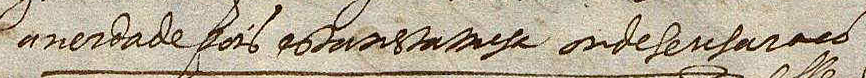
a uerdade pois esta nesta mesa onde se usara cō
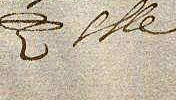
Elle
